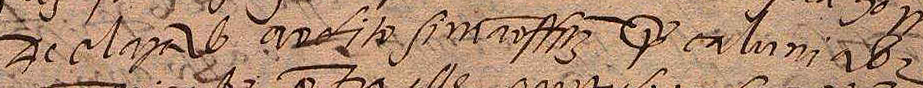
Declarādo ao dito simão ffrrz̄ p̄o caluniador
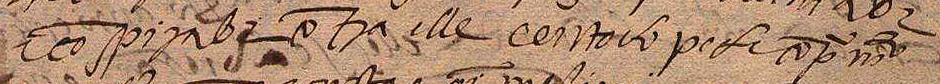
e cōspirador c̄otra elle e en todo pede c̄op̄mto
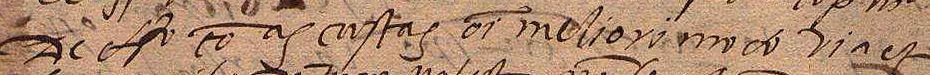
De drto cō as custas ōi meliori modo via et
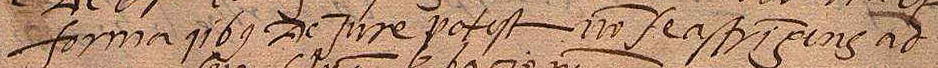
forma qibꝯ De Jure potest nō se astrīgens ad
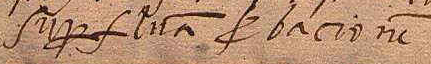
suꝑfluā ꝓbacionē
